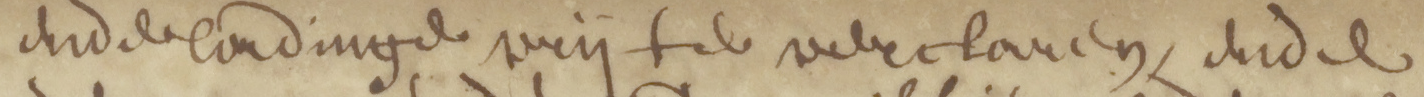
ende ladinge vrij te verclaren, ende
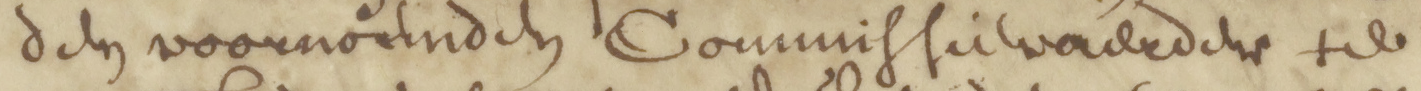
den voornoemden Commissievaerder te
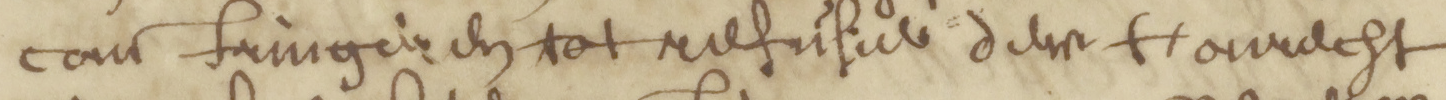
constringeren tot refusie deur t'onrecht
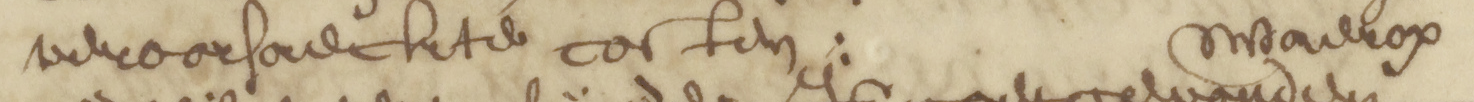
veroorsaeckte costen: Waerop
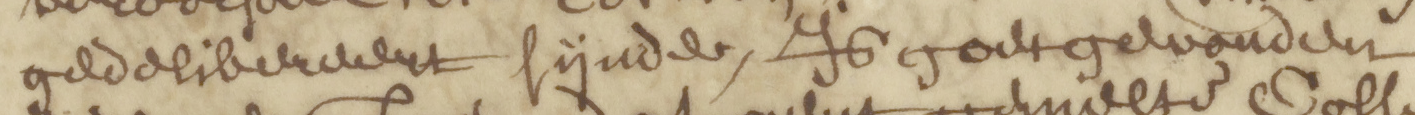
gedelibereert sijnde, Is goetgevonden
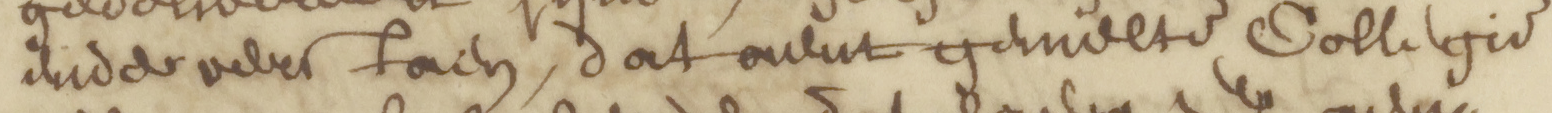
ende verstaen, dat aent gemelte Collegie
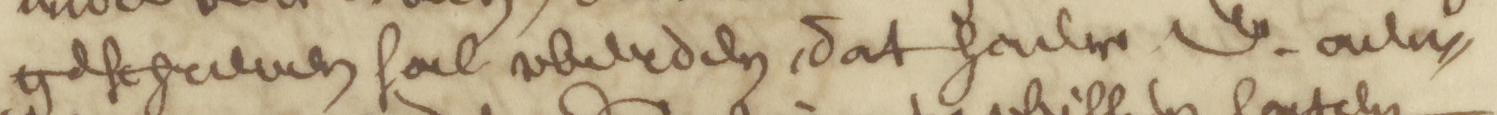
geschreven sal werden, dat haer E. aen,,
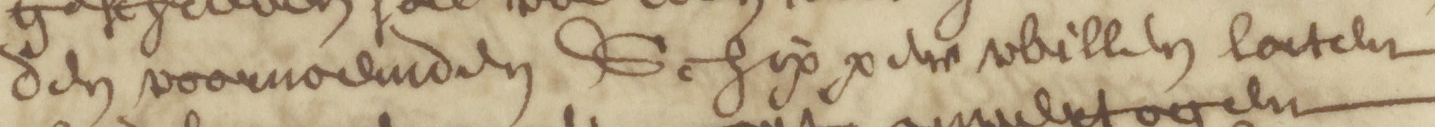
den voornoemden Schipper willen laten
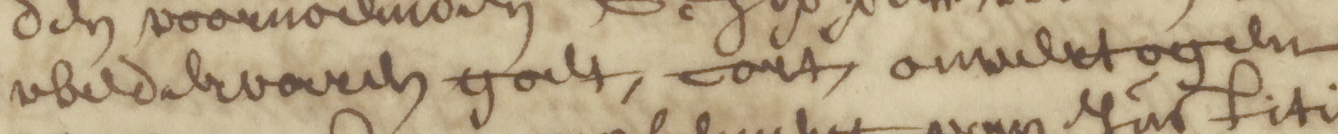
wedervaren goet, cort, onvertogen
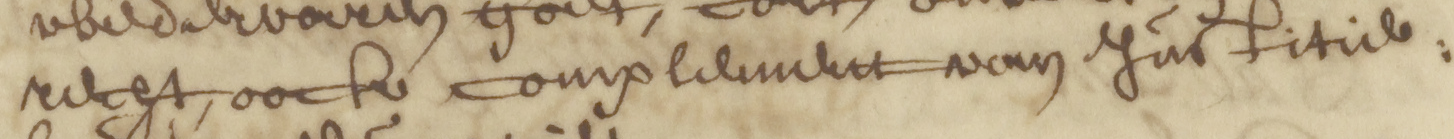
recht, oock complement van Justitie:
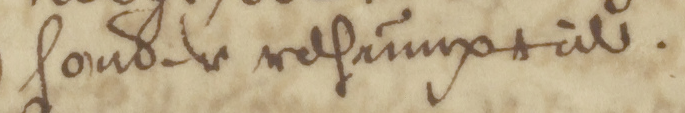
sonder resumptie.
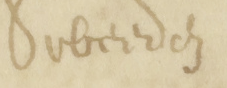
Sweeden
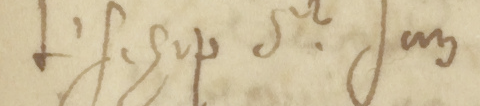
t' Schip St. Jan
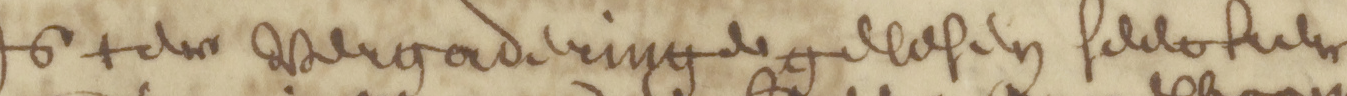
Is ter Vergaderinge gelesen seecker
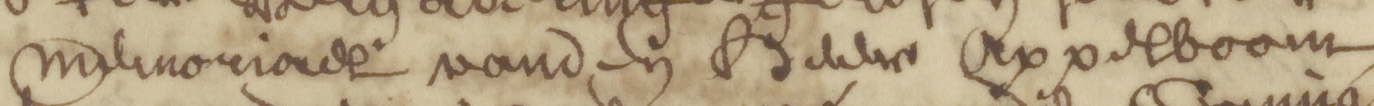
memoriael vanden Heer Appelboom
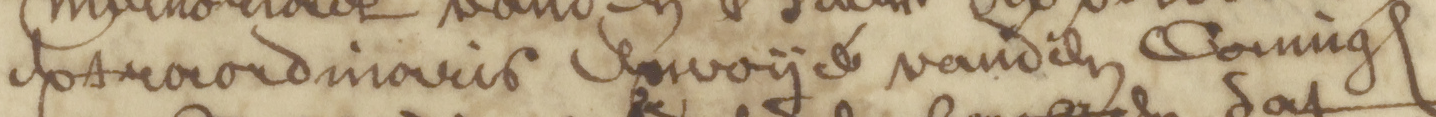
extraordinaris Envoijé vanden Coningh
